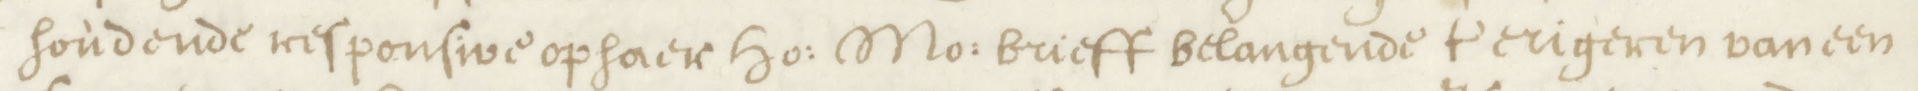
houdende responsive op haer Ho:Mo: brieff belangende t'erigeren van een
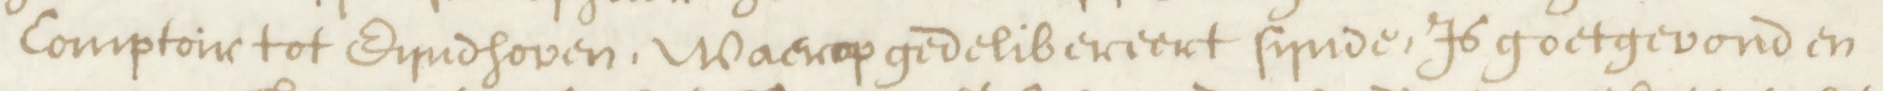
Comptoir tot Eyndhoven. Waerop gedelibereert synde, Is goetgevonden
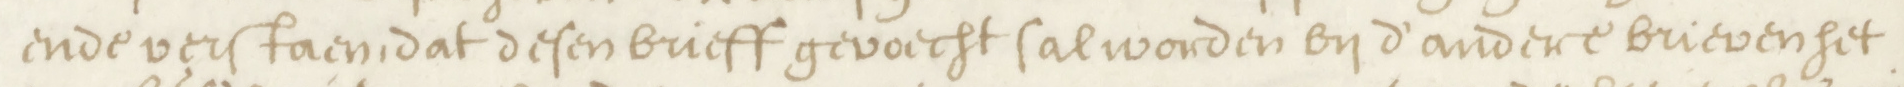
ende verstaen, dat desen brieff gevoecht sal worden by d'andere brieven het
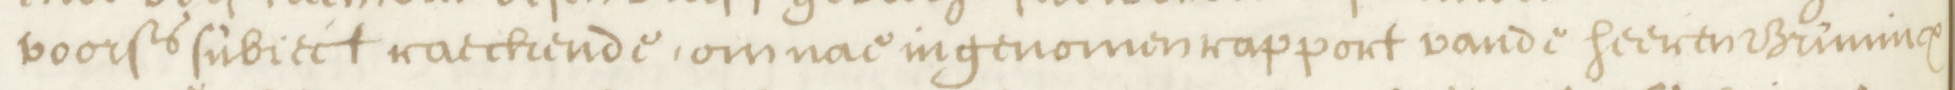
voors subiect raeckende, om nae ingenomen rapport vande heeren Brunincx
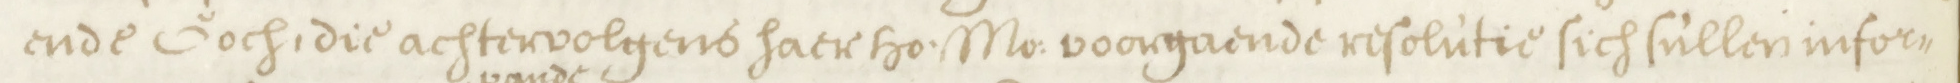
ende Goch, die achtervolgens haer ho:Mo: voorgaende resolutie sich sullen infor,,
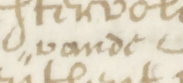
,,vande
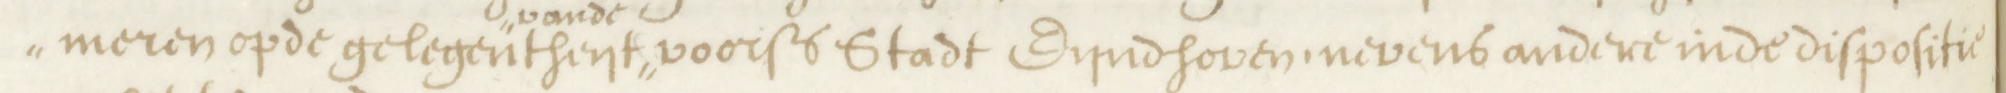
,,meren opde gelegentheyt,, voors Stadt Eyndhoven, nevens andere inde dispositie
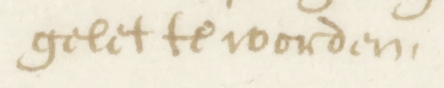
gelet te worden.
